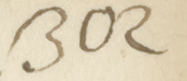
302
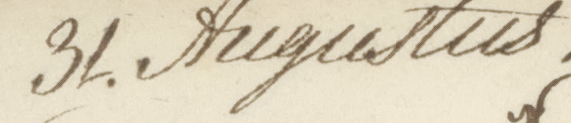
31. Augustus.
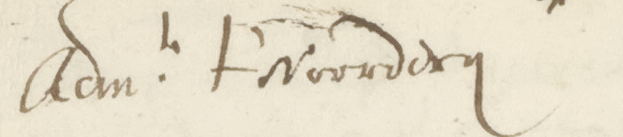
Admt. t'noorderqr
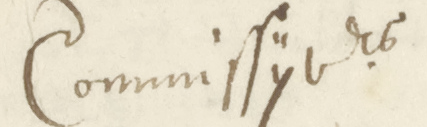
Comissyvrs.
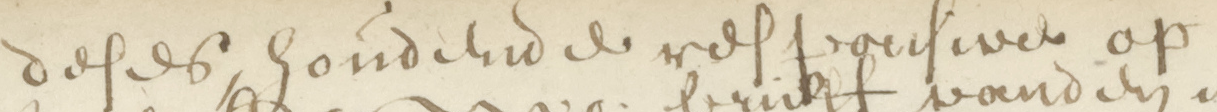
deses houdende responsive op
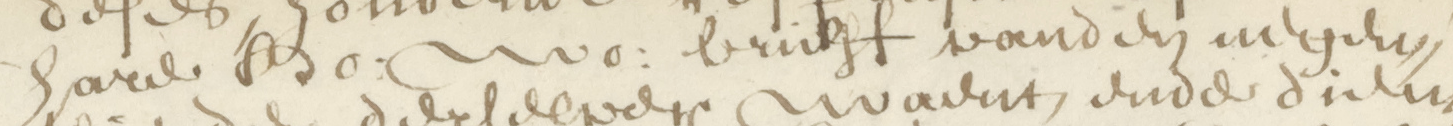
hare Ho:Mo: brieff vanden negen,,
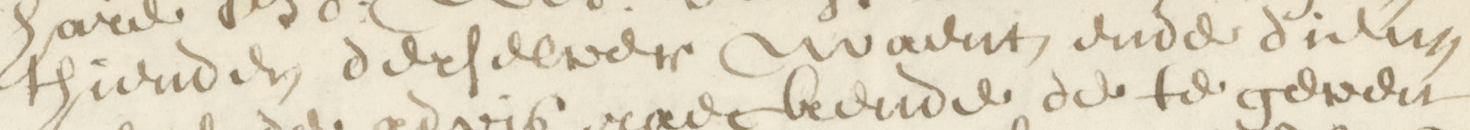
thienden derselver maent, ende dien„
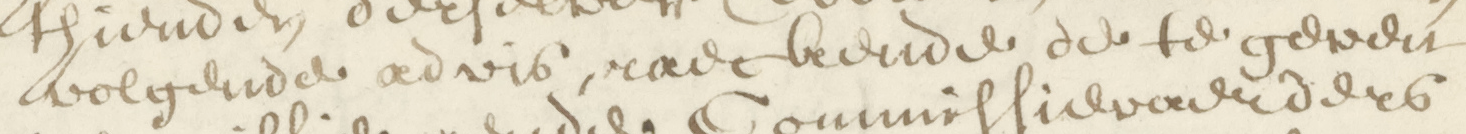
volgende advis, raeckende de te geven
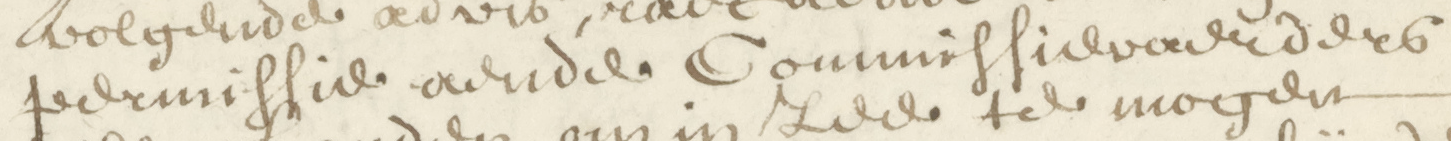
permissie aende Commissievaerders
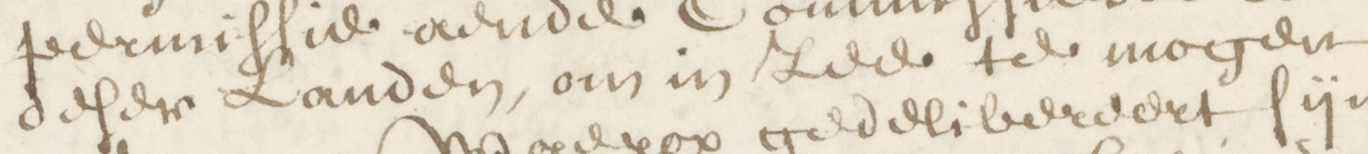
deser Landen, om in Zee te mogen
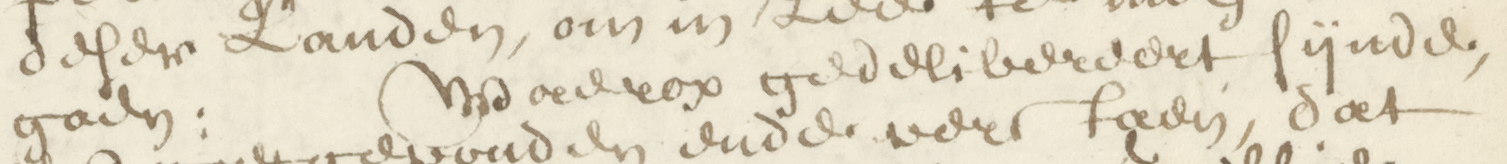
gaen: Waerop gedelibereert sijnde,
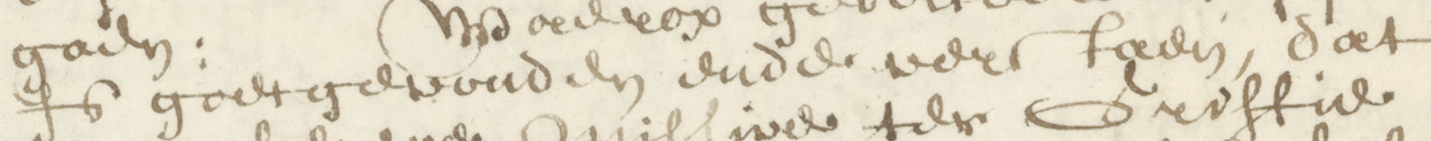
is goetgevonden ende verstaen, dat
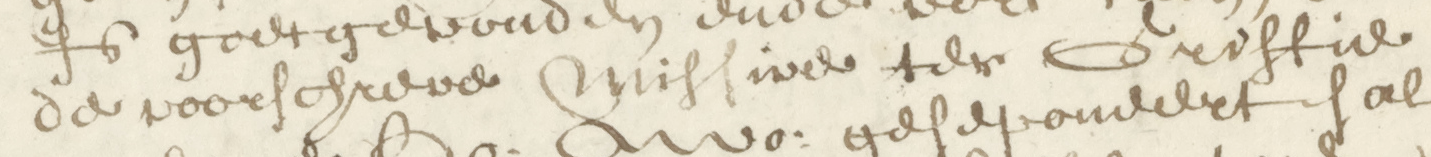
de voorschreve missive ter Griffie
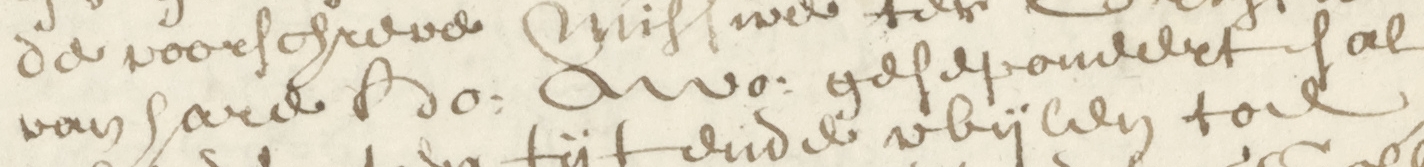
van hare Ho:Mo: geseponeert sal
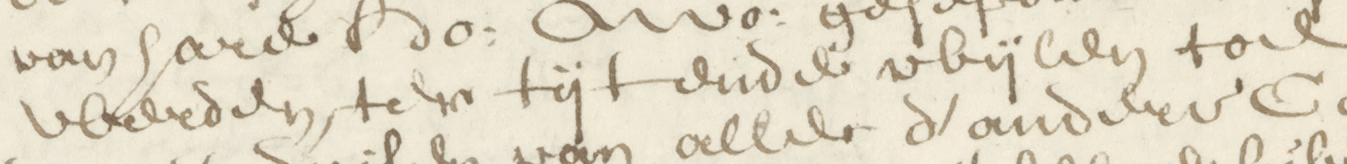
werden, ter tijt ende wijlen toe
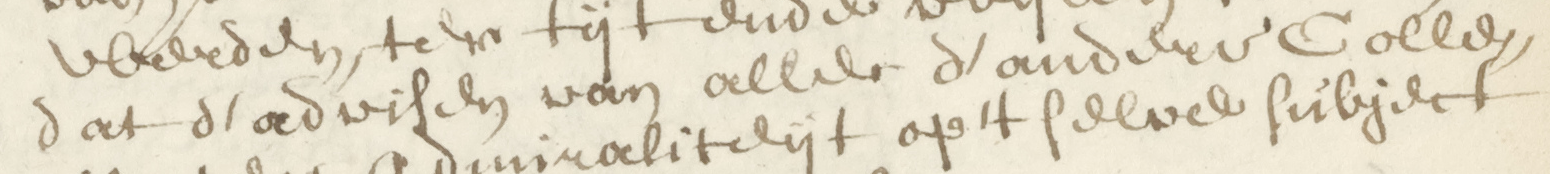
dat d'advisen van alle d'andere Colle„
